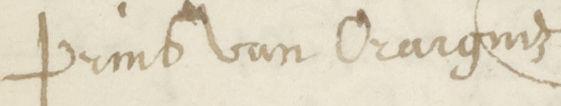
Prins van Orangnen
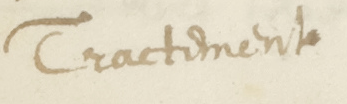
Tractement
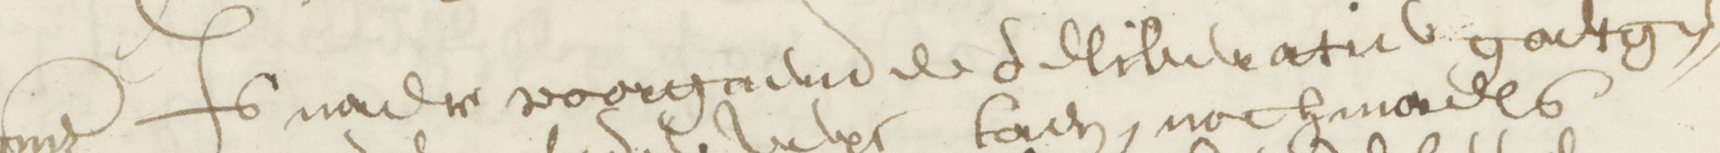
Is naer voorgaende deliberatie goetge„
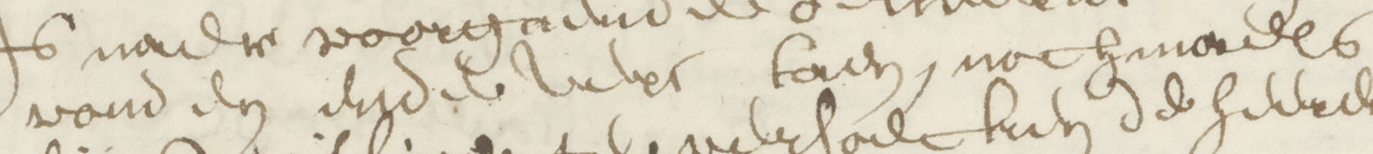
vonden ende verstaen, nochmaels
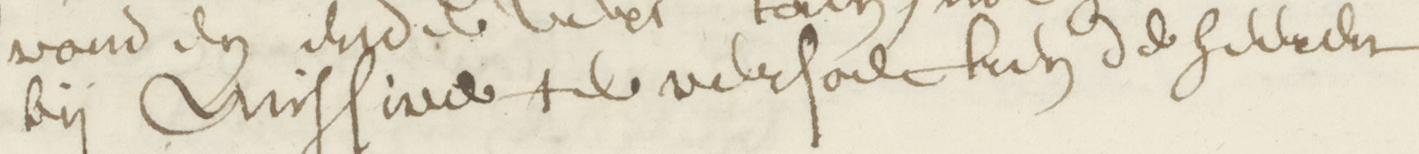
bij Missive te versoecken de heeren
